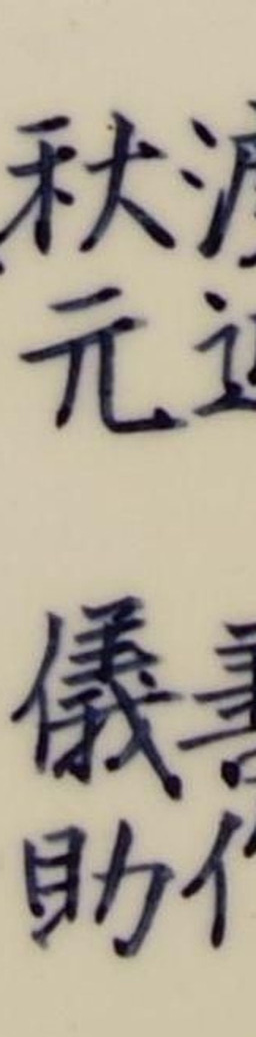秋元儀助
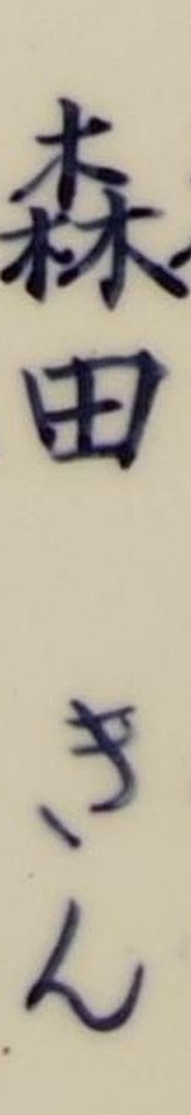森田きん
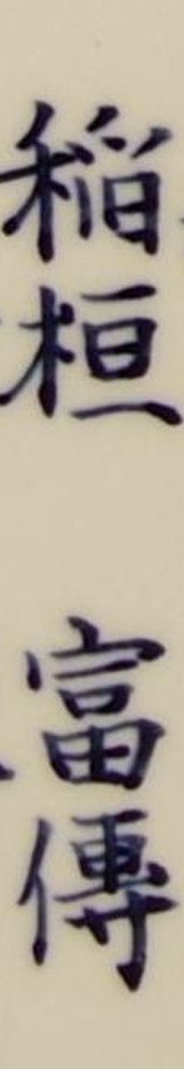稲垣富傳
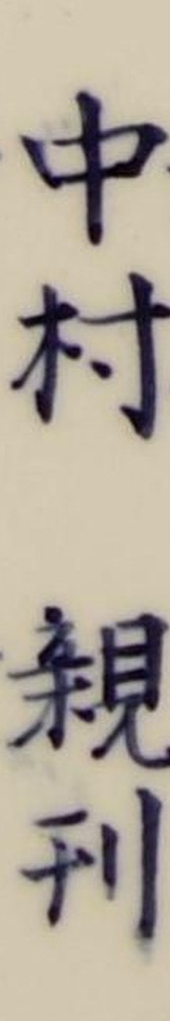中村親刊
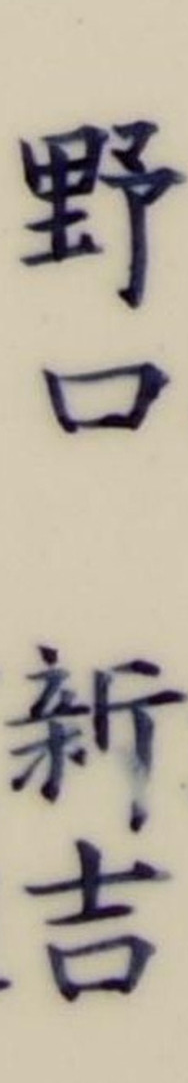野口新吉
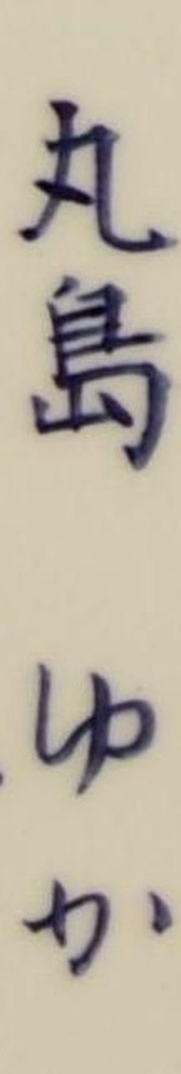丸島ゆか
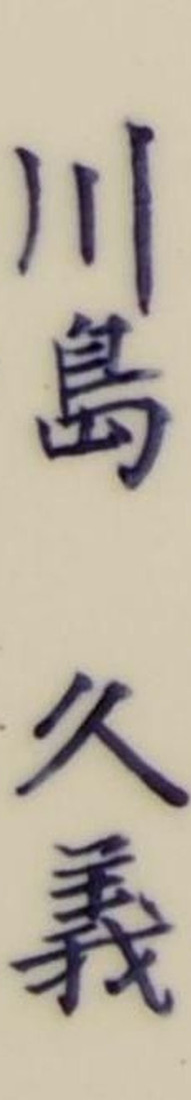川島久義
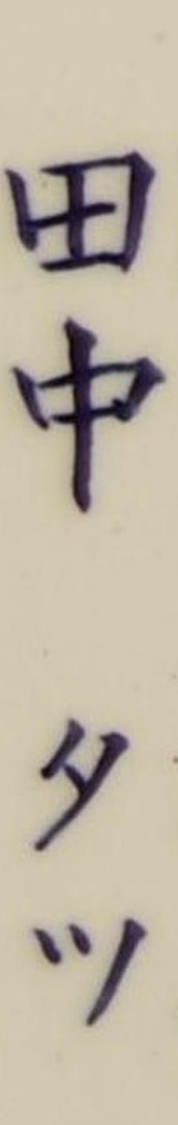田中タツ
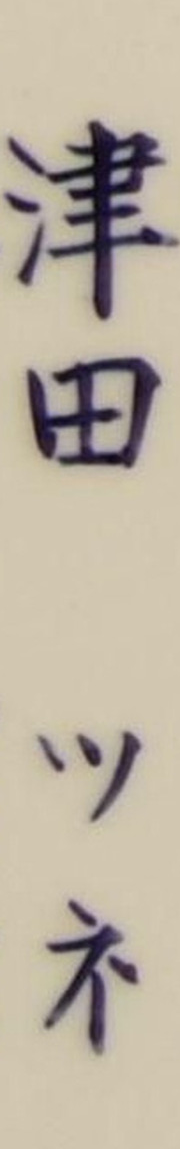津田ツネ
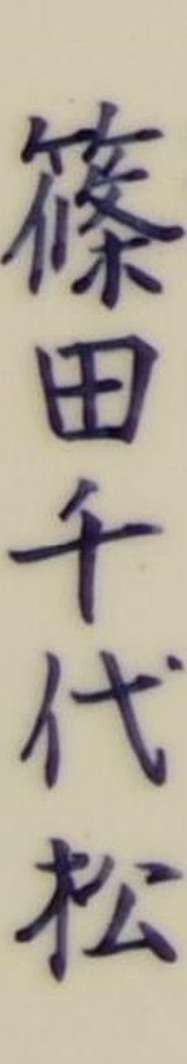篠田千代松
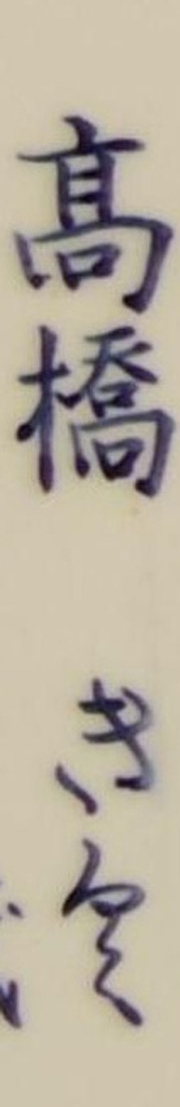高橋きく

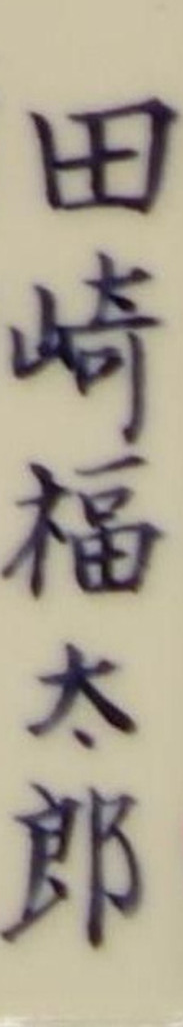田崎福太郎
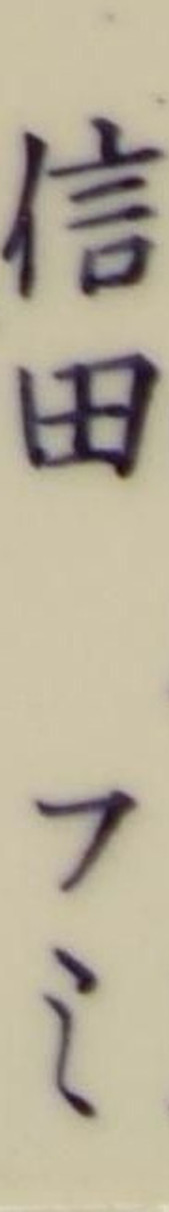信田フミ
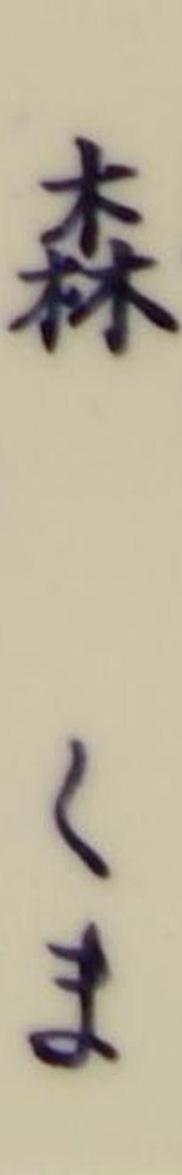森くま
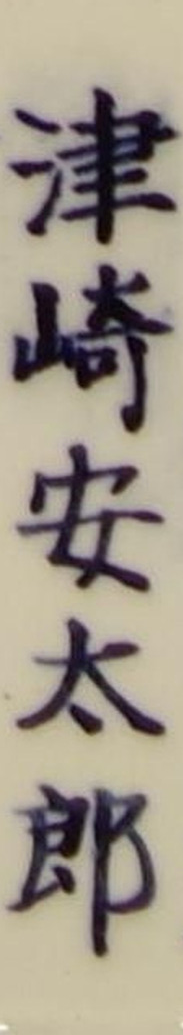津崎安太郎
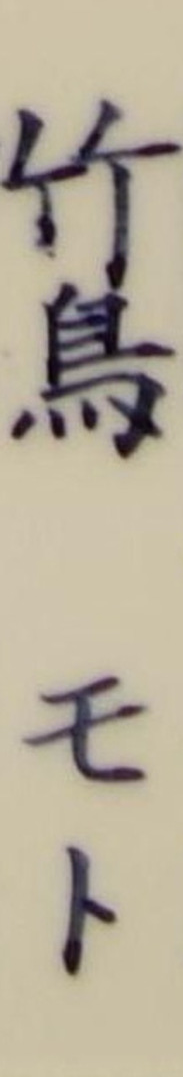竹鳥モト
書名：A~D
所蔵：koyasan kongobuji
